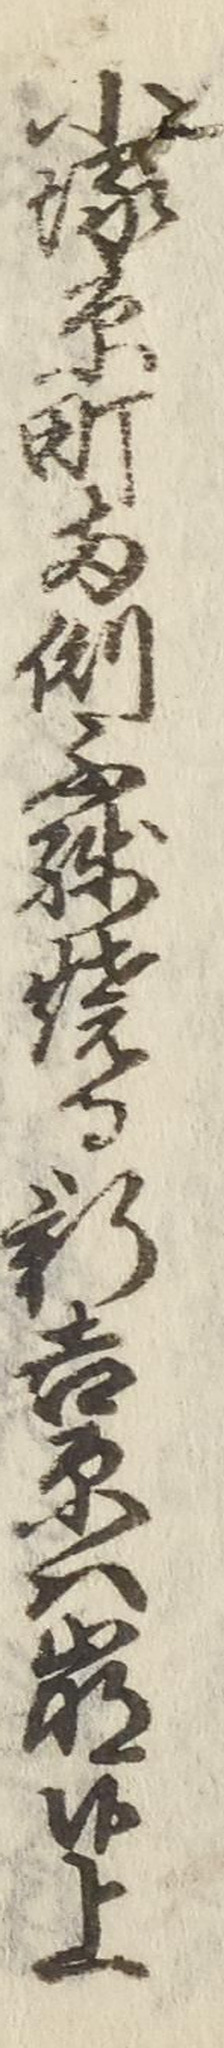小塚原町両側不残焼る新吉原は崩候上
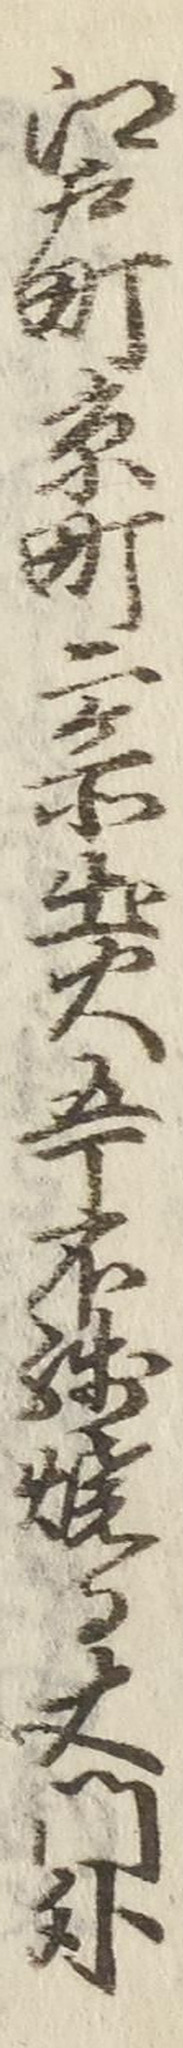江戸町京町二ヶ所出火五丁不残焼る大門外
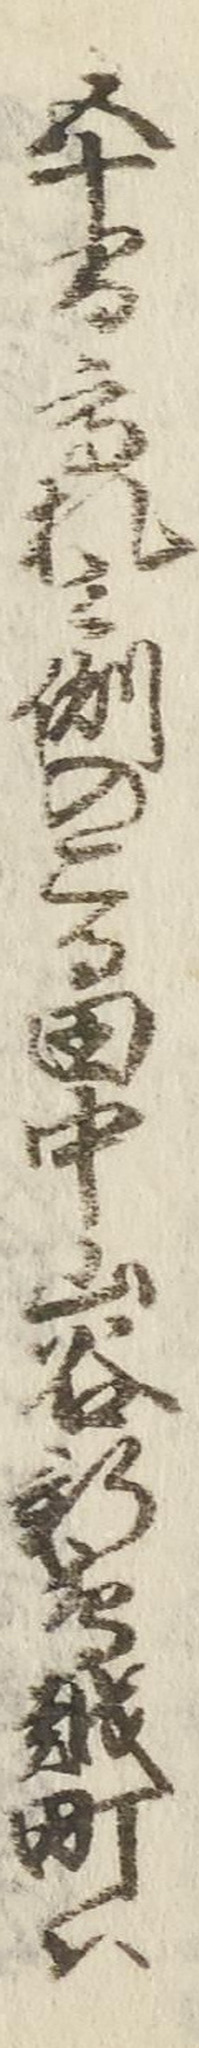五十間高札之側のこる田中山谷新鳥越町は
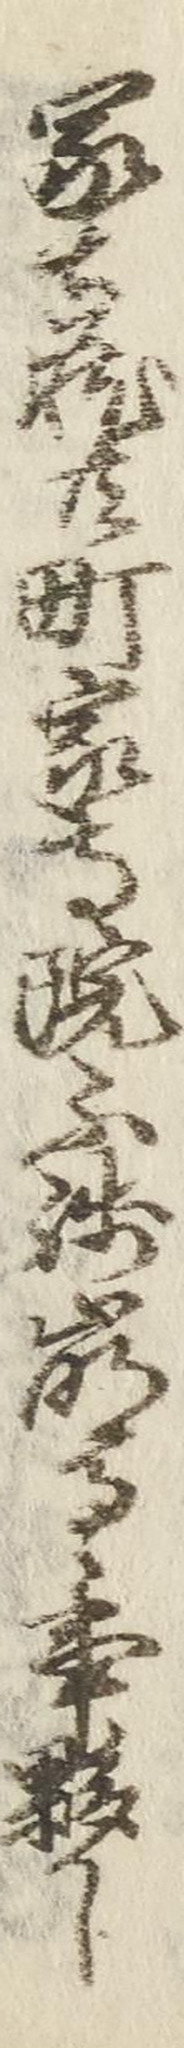家土蔵共町家寺院不残崩るゝ事夥し
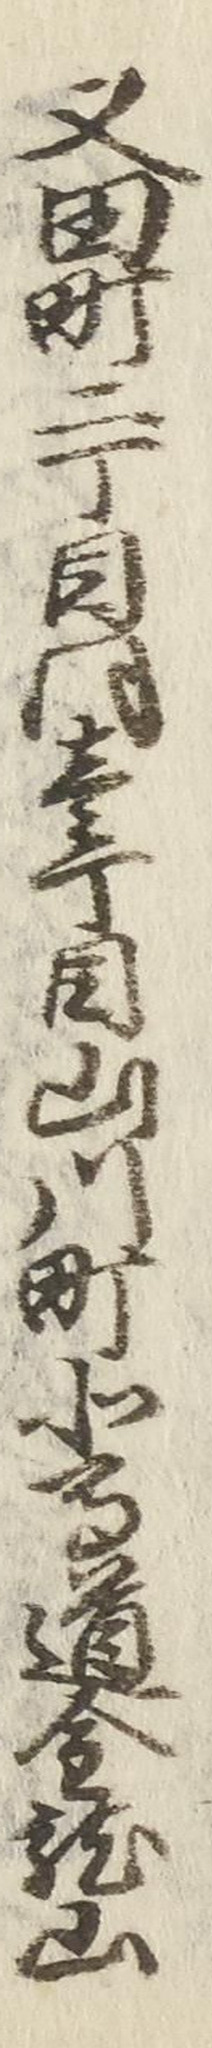又田町二丁目同壱丁目山川町北馬通金龍山
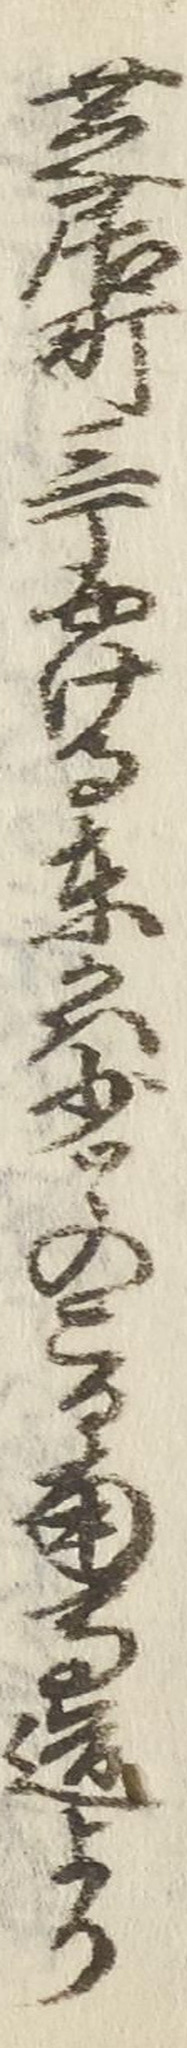芝居町三丁やける東かは少々のこる南馬道より
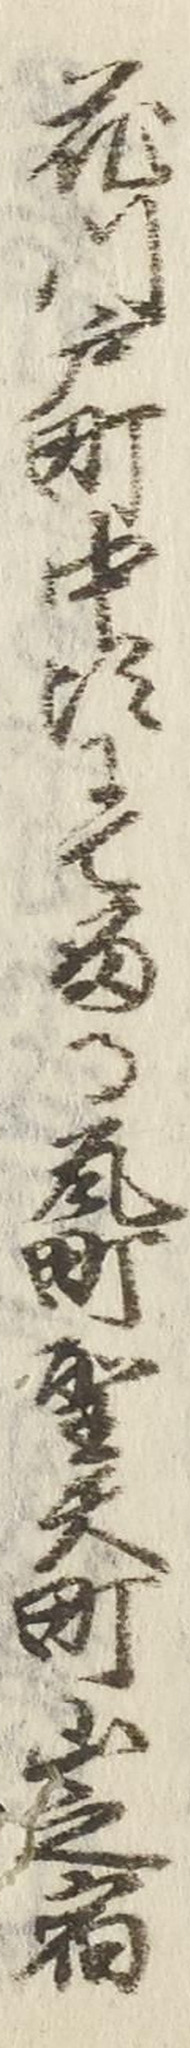花川戸町中頃にて留る瓦町聖天町山之宿
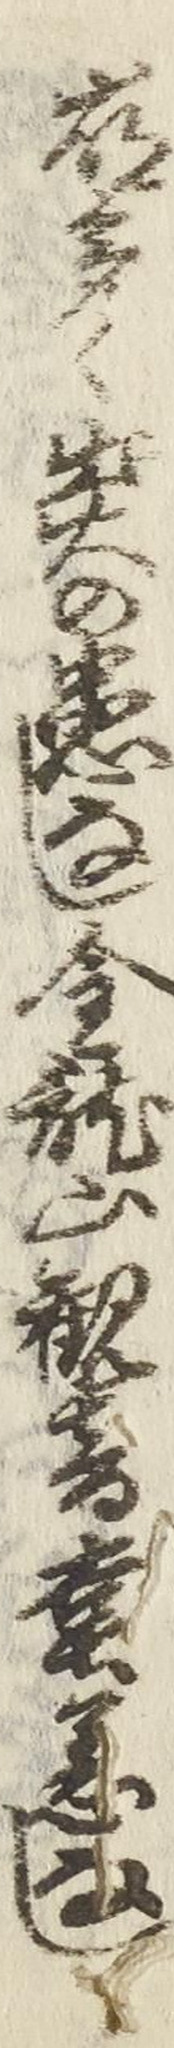崩多く出火の患なし金龍山観音堂恙なし
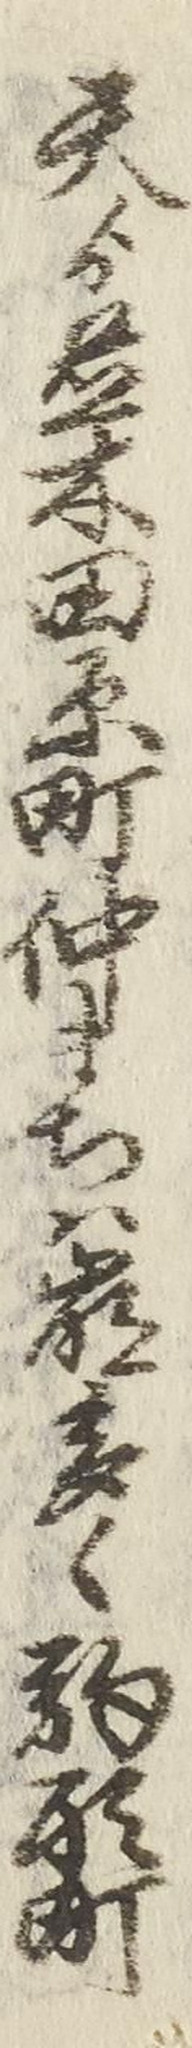夫ゟ並木田原町仲まちは崩多く駒形町
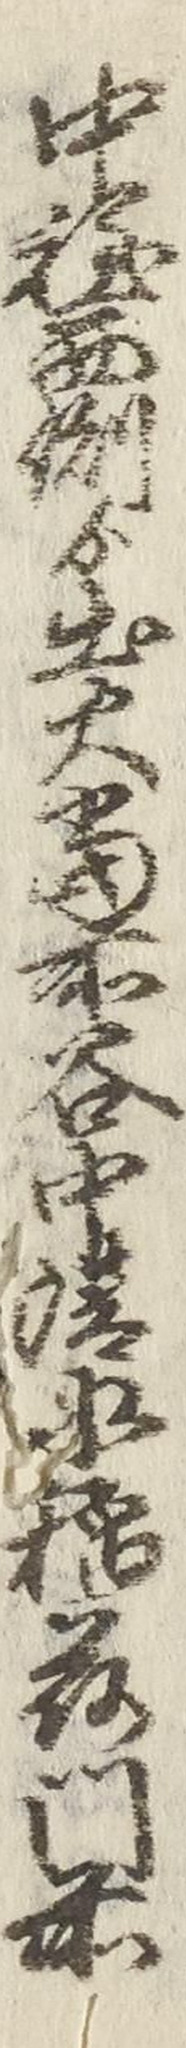中程西側ゟ出火当所谷中清水稲荷門前
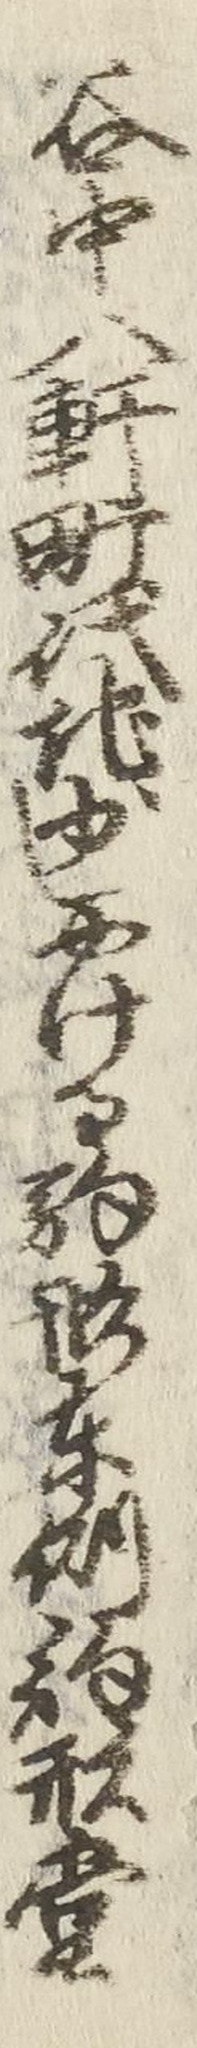谷中八軒町代地少しやける駒形東側駒形堂
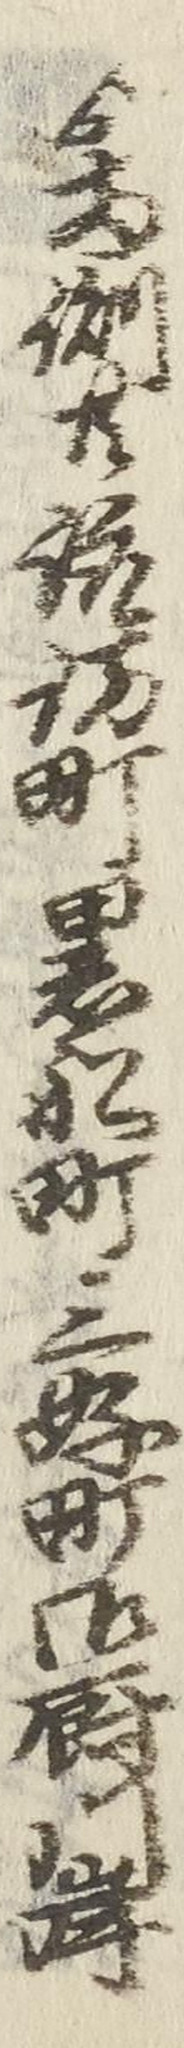ゟ両側共諏訪町黒船町三好町御厩川岸
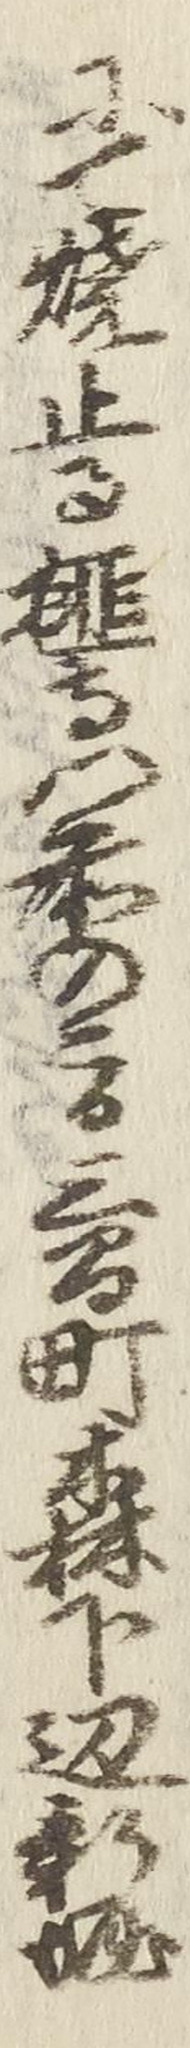にて焼止る榧寺門前のこる三間町森下辺新堀
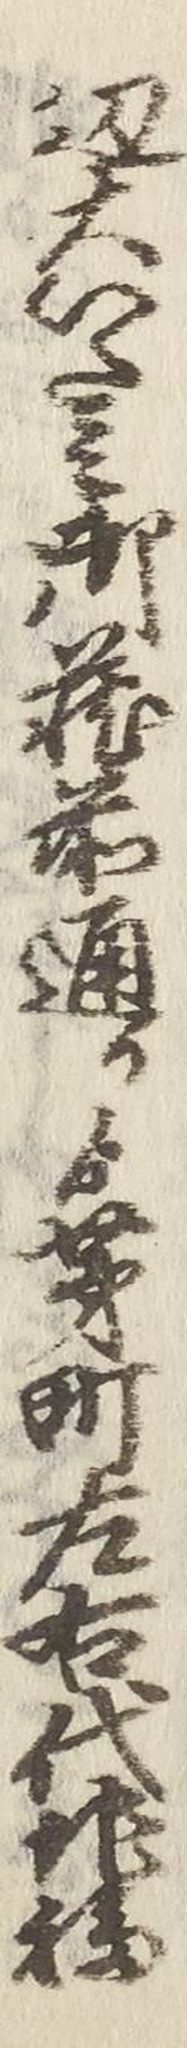辺大いたみ御蔵前通りゟ茅丁左右代地福
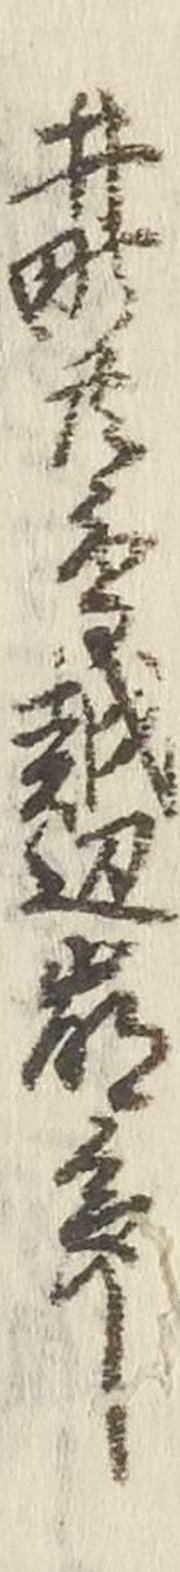井町共鳥越辺崩多し
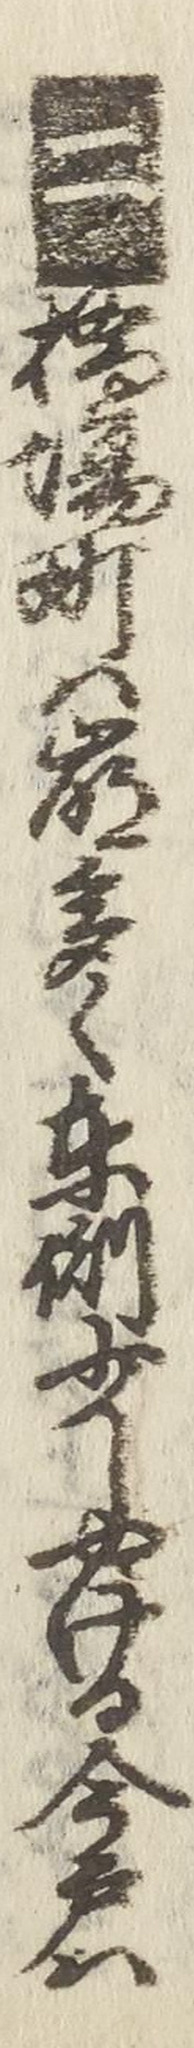二橋場町は崩多く東側少しやける今戸は
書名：地震出火　男女死人怪我人書上之寫
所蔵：東京大学地震研究所図書室 Earthquake Research Institute Library, The University of Tokyo, JAPAN
